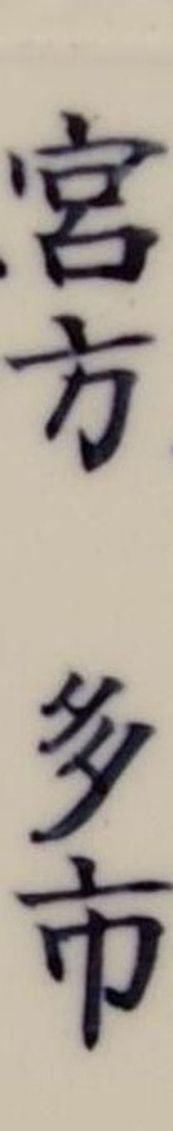宮方多市
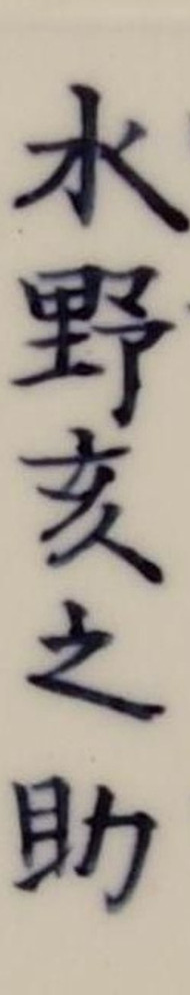水野亥之助
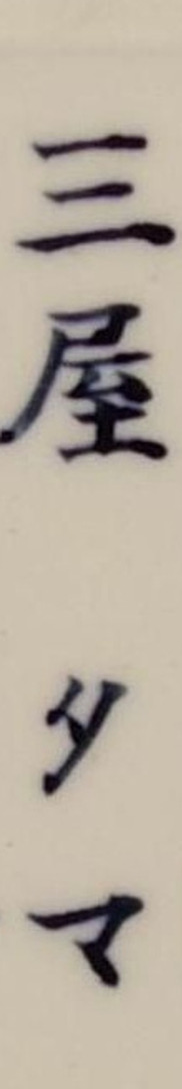三屋タマ
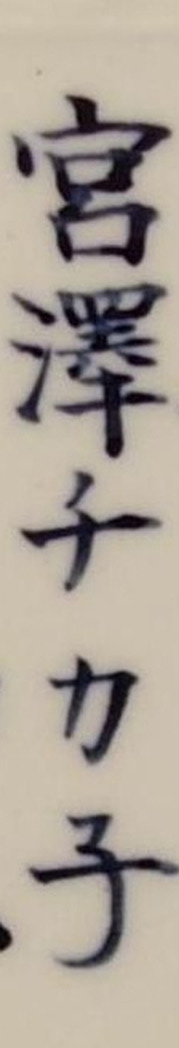宮澤チカ子
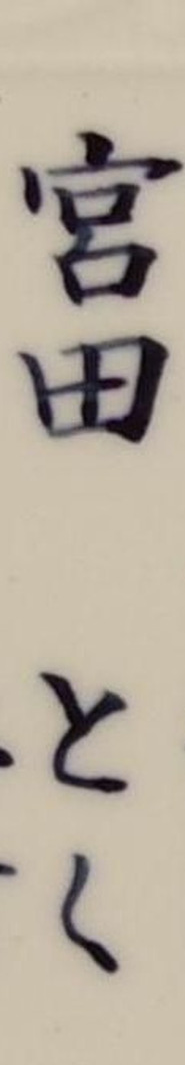宮田とく
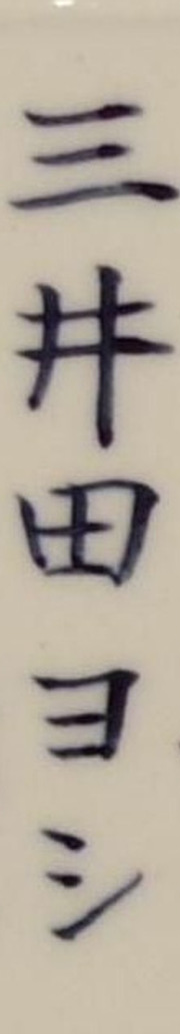三井田ヨシ
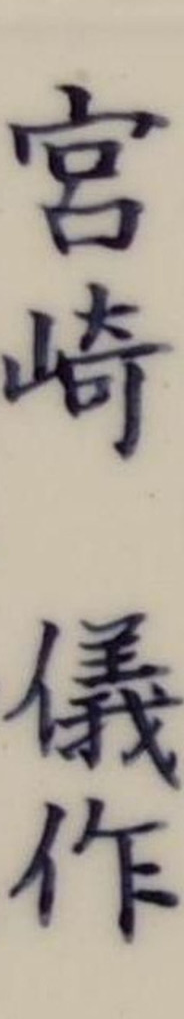宮崎儀作
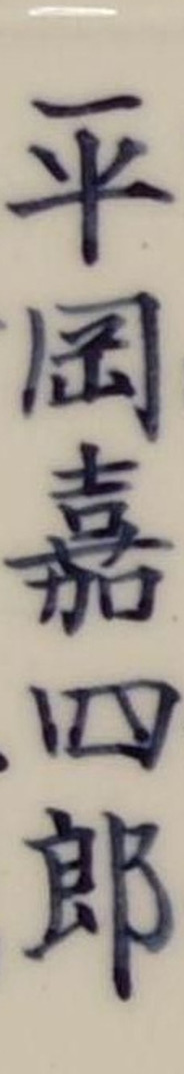平岡嘉四郎
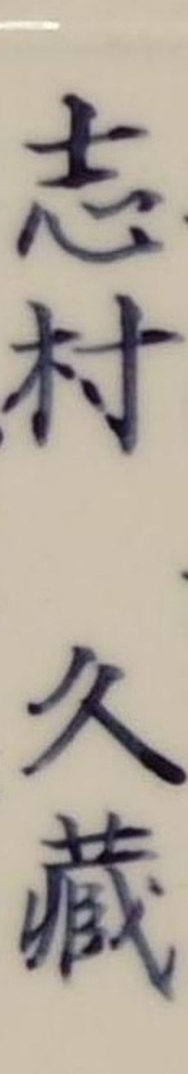志村久蔵
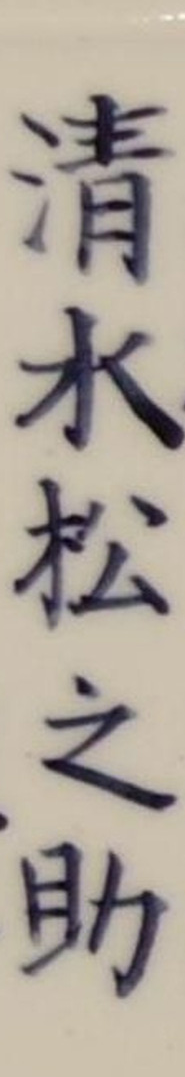清水松之助
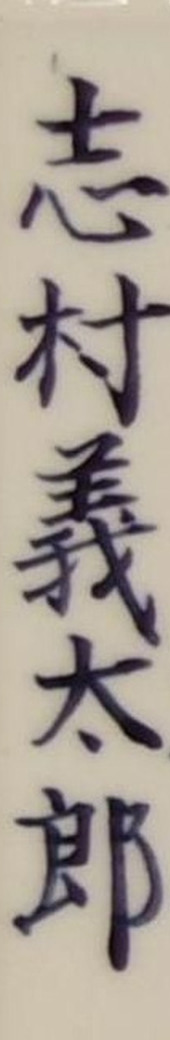志村義太郎

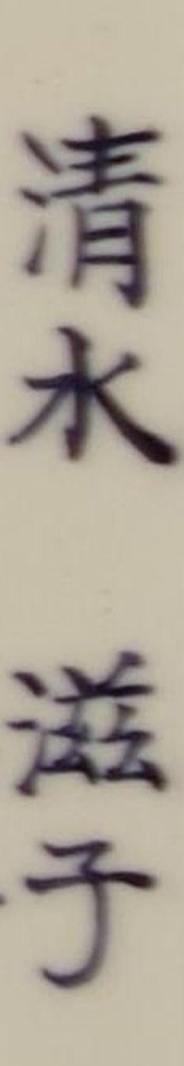清水滋子
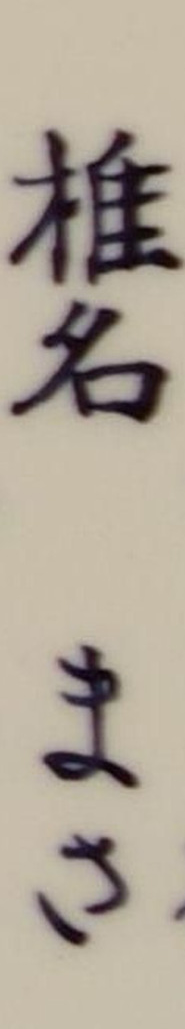椎名まさ
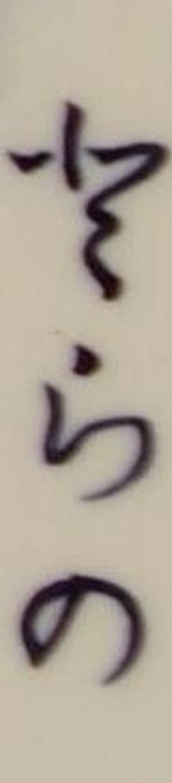とらの
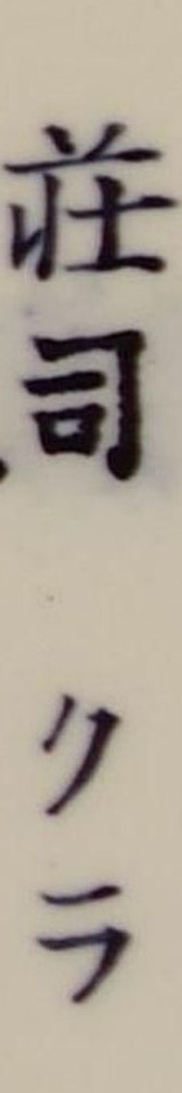荘司クラ
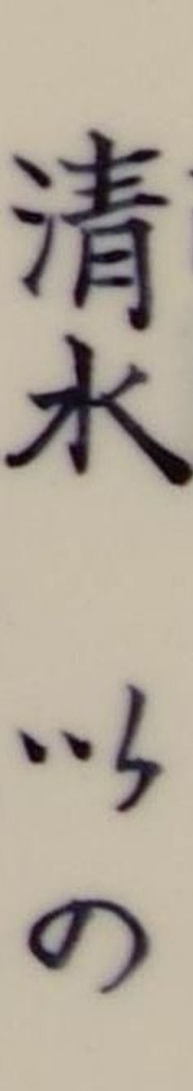清水いの
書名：E~L
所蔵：高野山金剛峯寺
